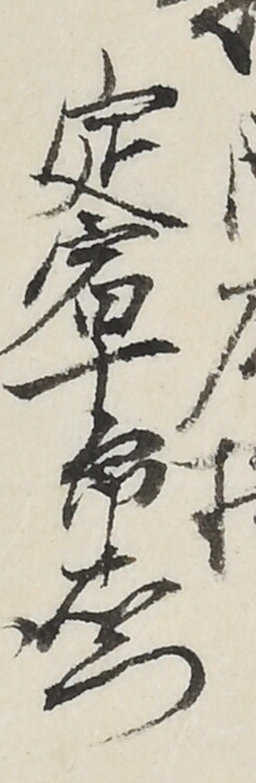定宿十郎右衛門
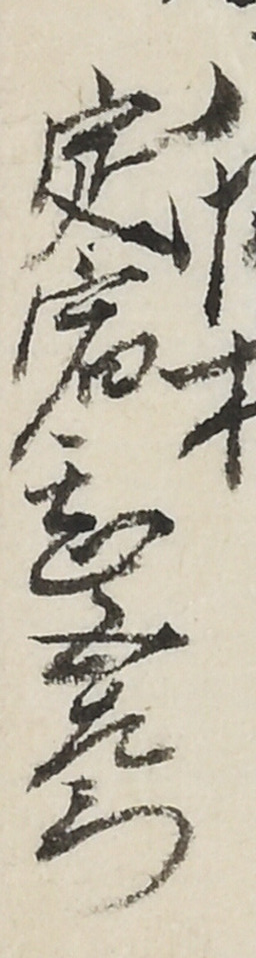定宿甚五左衛門

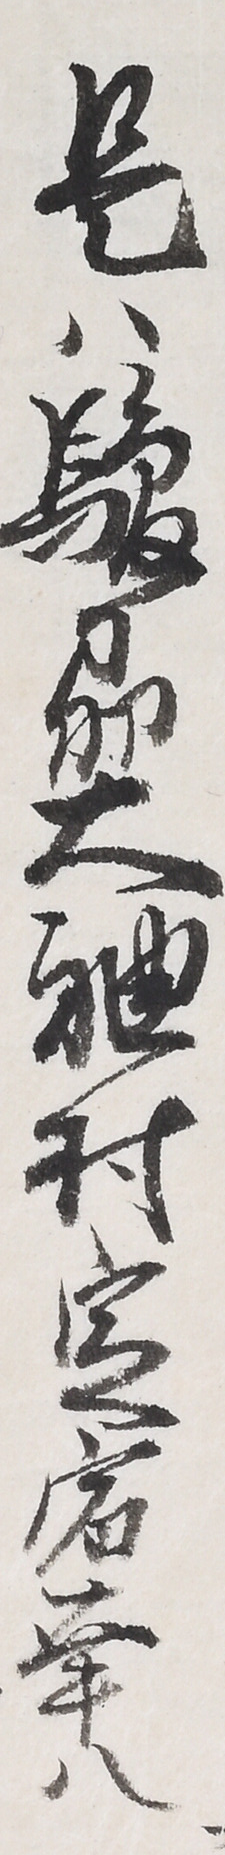是ハ駿州大袖村定宿幸八
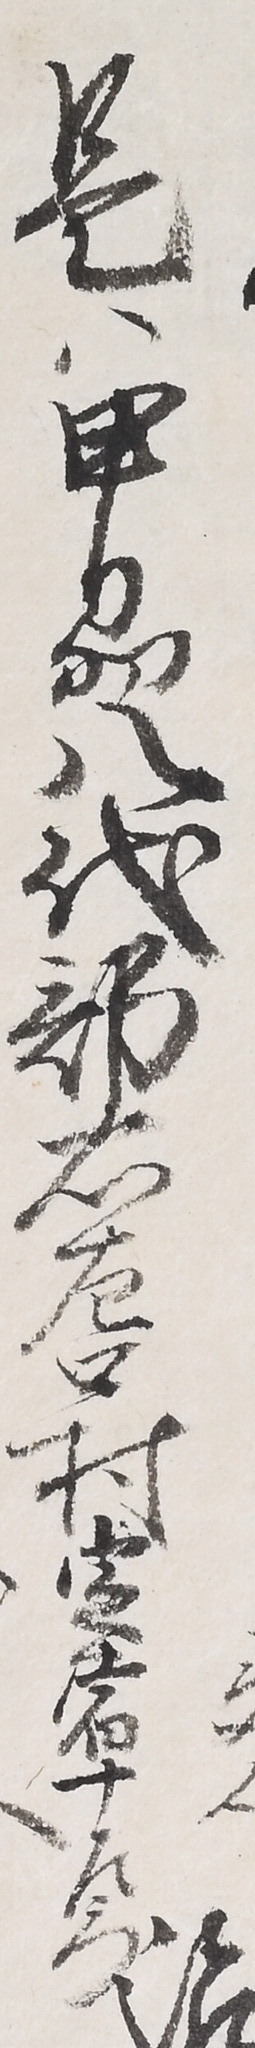是ハ甲州八代郡右左口村定宿十左衛門
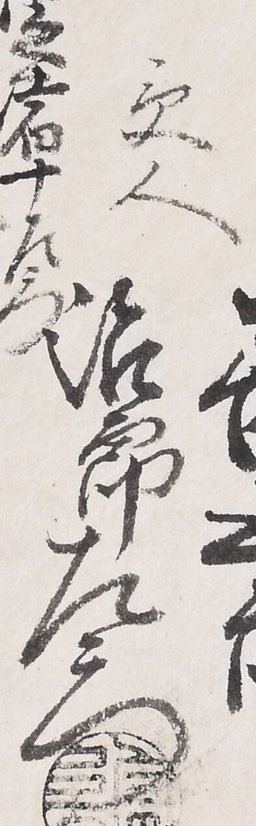伊勢屋治郎左衛門
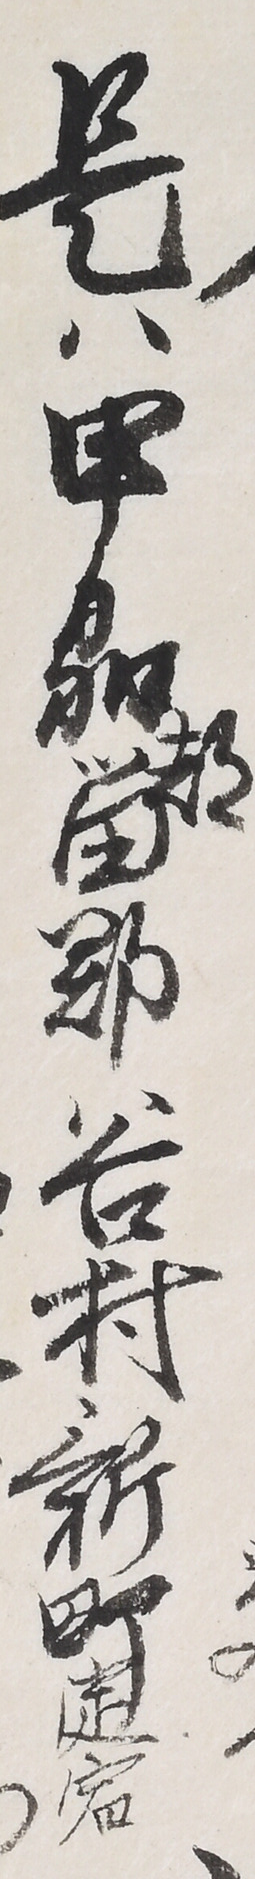是ハ甲州都留郡谷村新町定宿
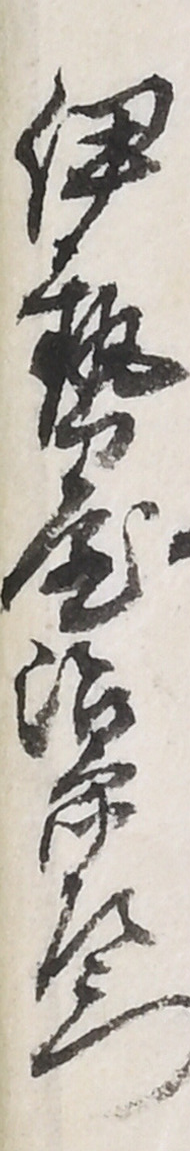伊勢屋治郎左衛門
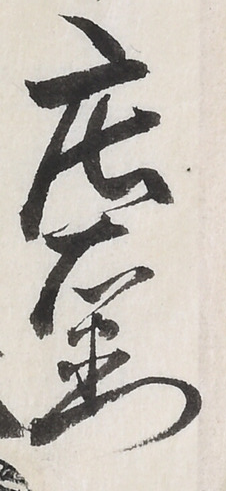与右衛門
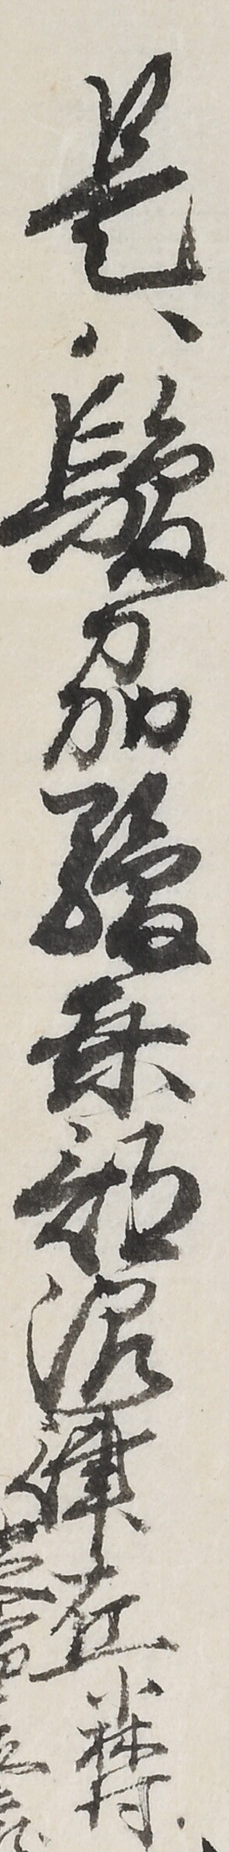是ハ駿州駿東郡沼津在小林村
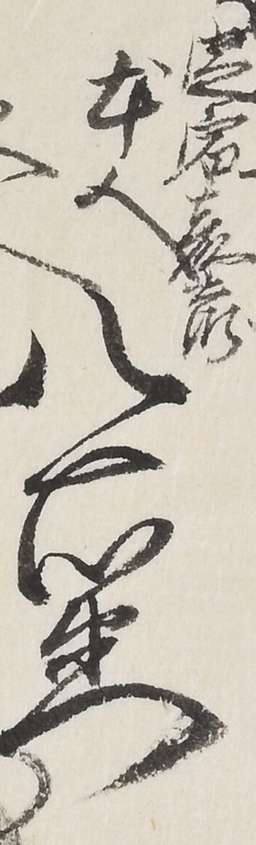与右衛門
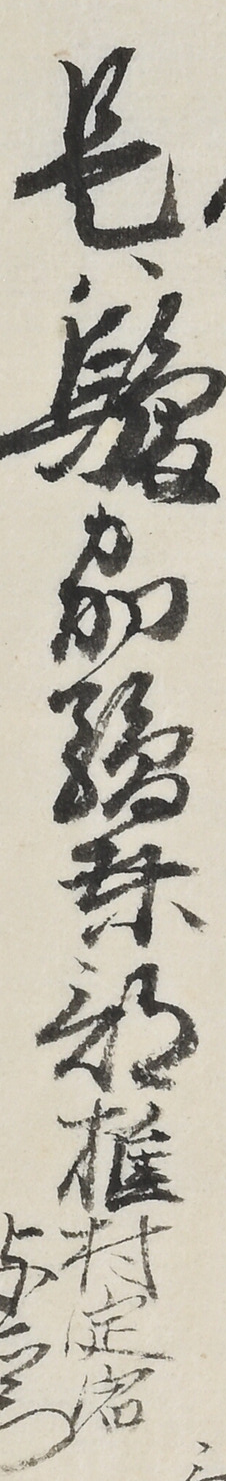是ハ駿州駿東郡椎村定宿
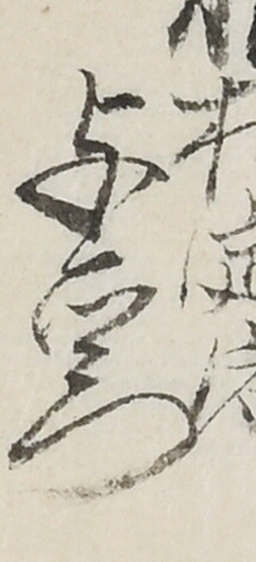与右衛門
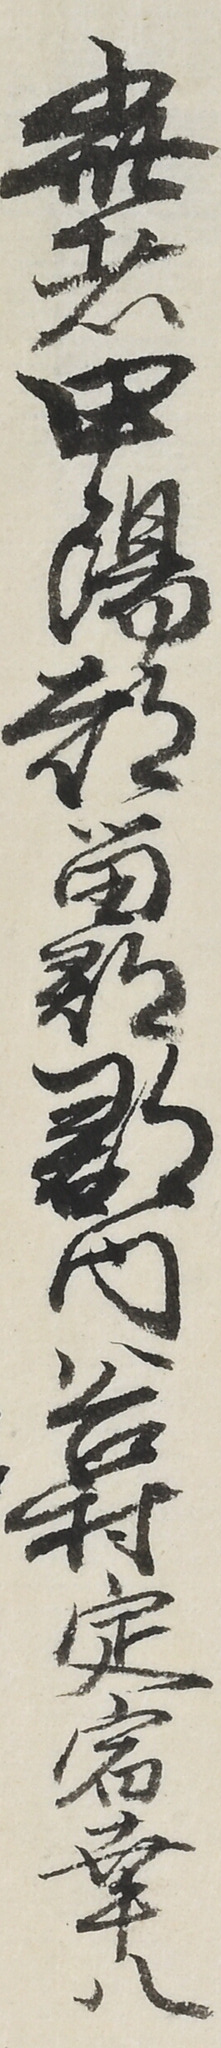此者甲陽都留郡郡内谷村定宿幸八
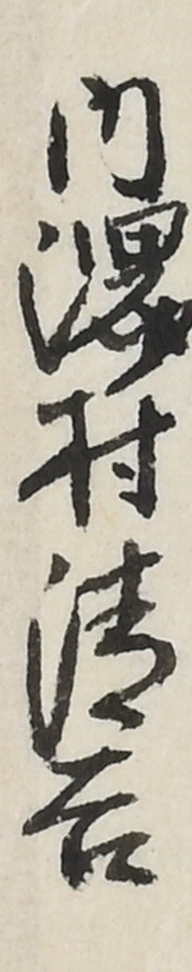内堺村清吉

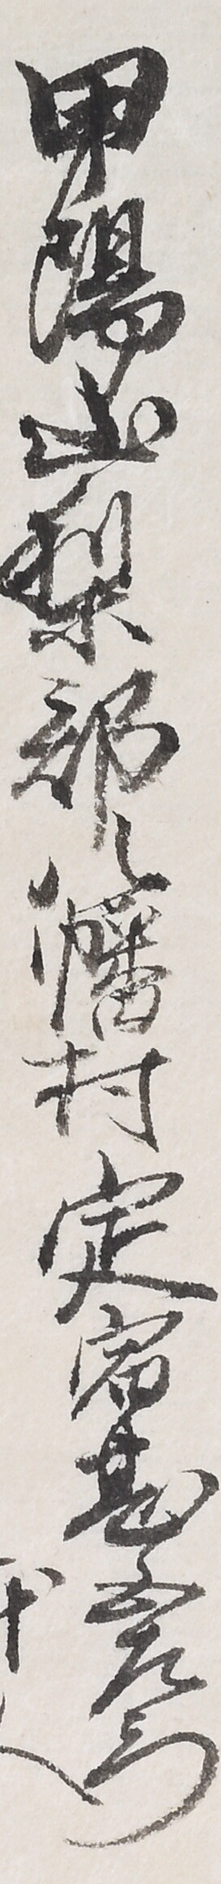甲陽山梨郡八幡村定宿甚五左衛門
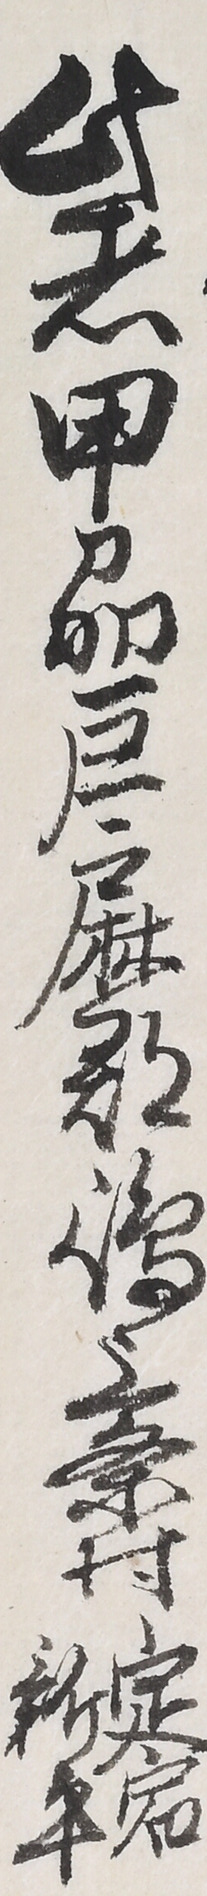此者甲州巨摩郡島上条村定宿新平
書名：天保十四癸卯年正月他國出石切名前書上帳控
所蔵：伊那市立高遠町図書館・合同会社AMANE
